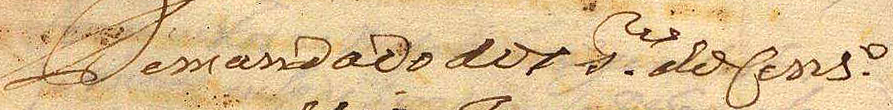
De mandado dos s.res do Cons.o
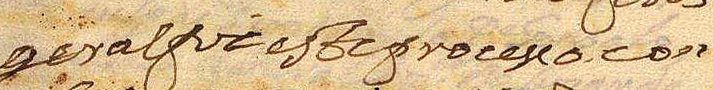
geral fiz este processo con
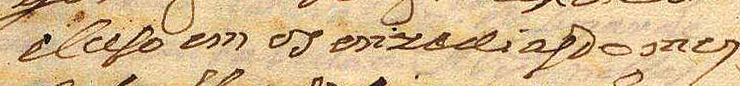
cluso em os onze dias do mez
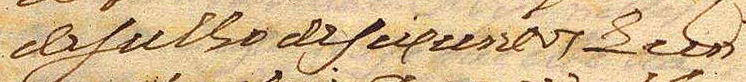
de Julho de seiscentos E cin
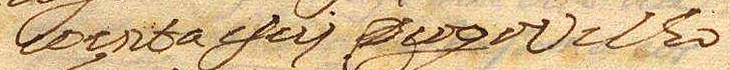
coenta e seis Diogo Velho
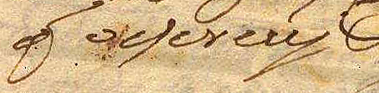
q̄ o escreuj
